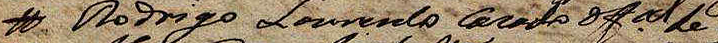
# Rodrigo Lourenço cazado off.al de
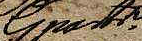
Espartr.a
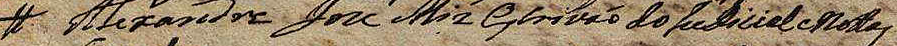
# Alexandre Joze Miz̄ escrivaõ do judicial e notas
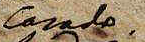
cazado.
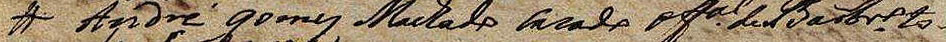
# André gomes Machado cazado off.al de Bartr.o to
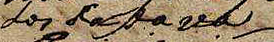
dos da d.a v.a
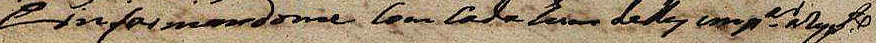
e informandome com cada hum delles em p.ar a Resp.to
